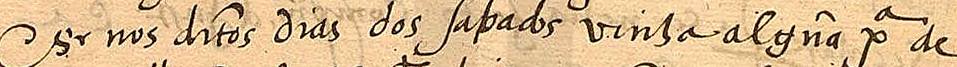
e se nos ditos dias dos Sabados vinha alguā pa de
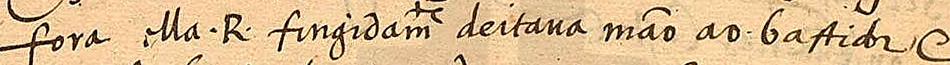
fora ella .R. fingidamte deitaua mão ao bastidor e
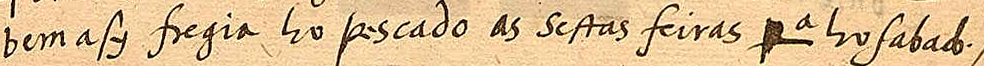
bem asy fregia ho pescado as sestas feiras ꝑa ho Sabado. /
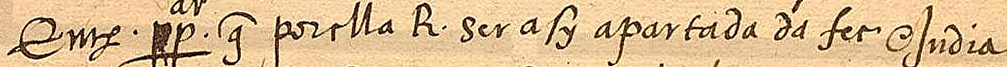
Entꝭ. ꝑꝑar. q̄ por ella R. ser asy apartada da fee e Judia
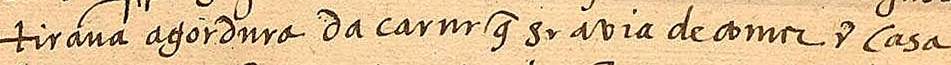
tiraua a gordura da carne q̄ se avia de comer ē casa
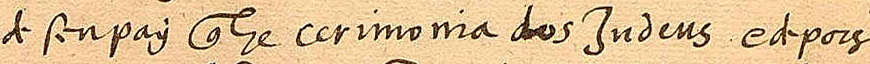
de seu pay q̄ he cerimonia dos Judeus e depois
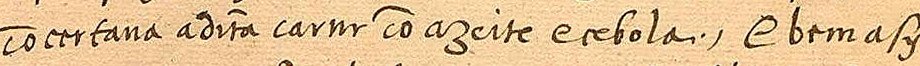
c̄ocertaua a dita carne c̄o azeite e cebola., e bem asy
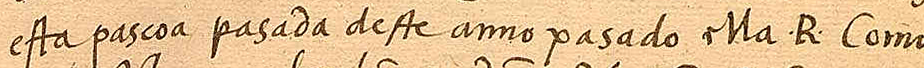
esta pascoa pasada deste anno pasado ella .R. Como
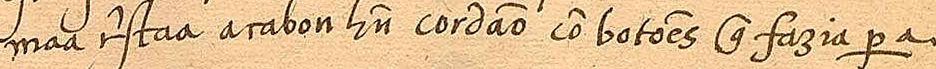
maa cistaa acabou hū cordão cō botoẽs q̄ fazia ꝑa
